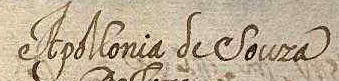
Apollonia de Souza
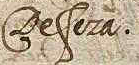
Defeza.
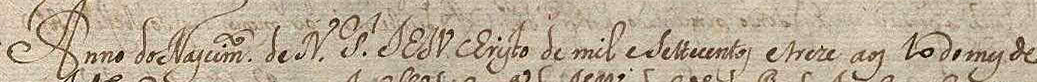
Anno do Nascim.to de N. S.or IESV christo de mil e Settecentos e treze aos 10 do mes de
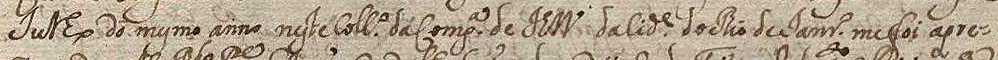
Iulho do mesmo anno neste Coll.o da Comp.a de JESV da Cid.e do Rio de Ianr.o me foi apre
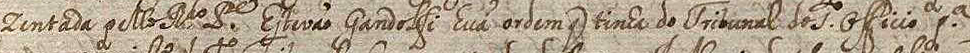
zentada pello R.do P.e Estevaõ Gandolfi huā ordem q̄ tinha do Tribunal do s.to officio p.a
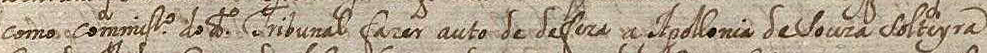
como commiss.o do d̄.o Tribunal fazer auto de defeza a Apollonia de Souza Solteyra
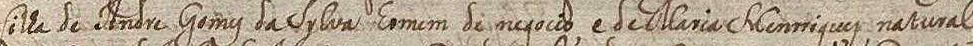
filha de Andre Gomes da Sylva homem de negocio, e de Maria Henrriques, natural
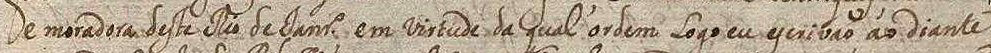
e moradora deste Rio de Ianr.o, em virtude da qual ordem Logo eu escrivaõ ao diante
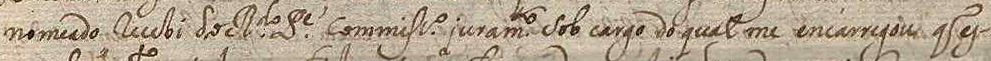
nomeado Recebi do R.do P.e commiss.o juram.to sob cargo do qual me encarregou q̄ es
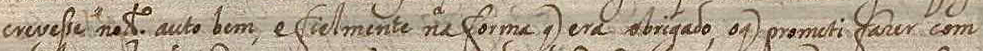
crevesse no d̄.o auto bem, e fielmente na forma q̄ era obrigado, o q̄ prometi fazer com
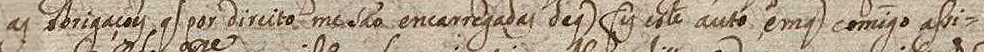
as obrigaçoẽs q̄ por direito me são encarregadas de q̄ fiz este auto, em q̄ comigo assi
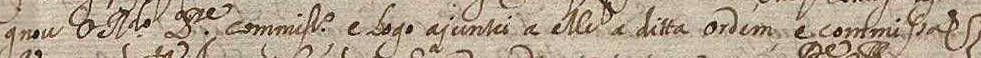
gnou o R.do P.e commiss.o e Logo ajuntei a elle a ditta ordem, e commissaõ,
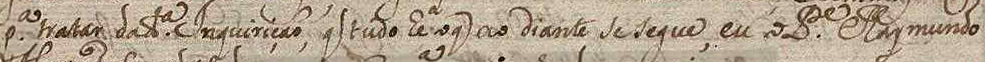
p.a tratar da d̄.a Inquiriçaõ, q̄ tudo hé o q̄ ao diante se segue, eu o P.e Raymundo
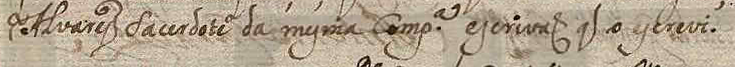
Alvares Sacerdote da mesma Comp.a escrivaõ q̄ o escrevi.
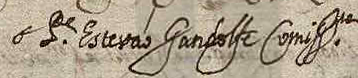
o P.e Estevaõ Gandolfe Comiss.ro
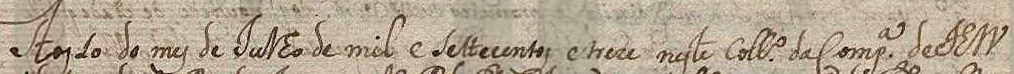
Aos 10 do mes de Iulho de mil e settecentos e treze neste Coll.o da Comp.a de IESV
